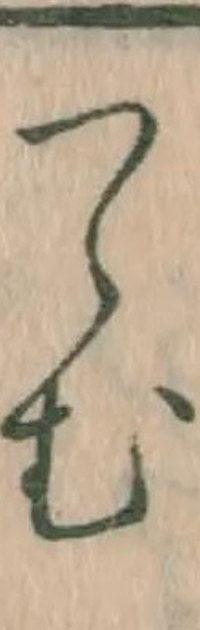つゝむ
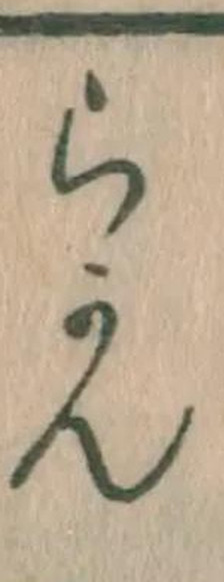らかん

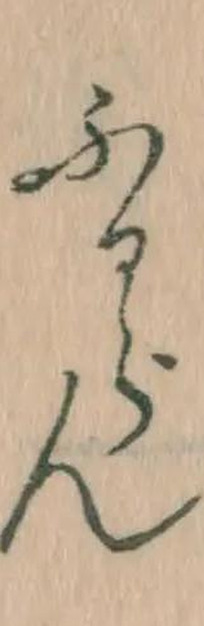ふるらん
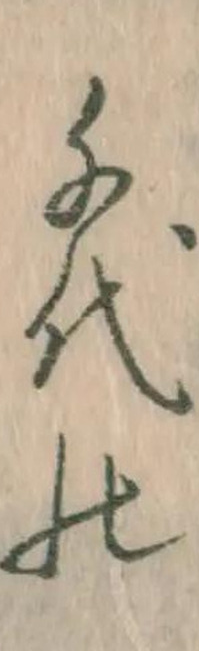千代の

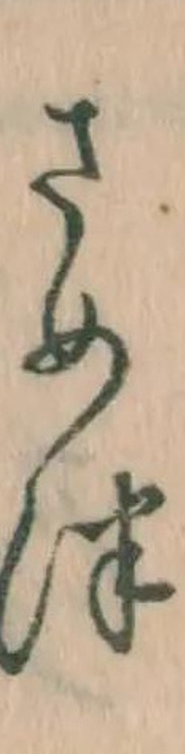さめつ
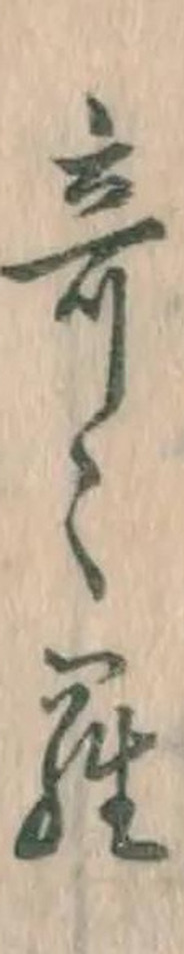奇々羅

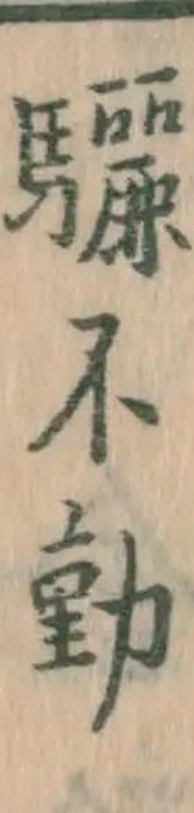驪不動
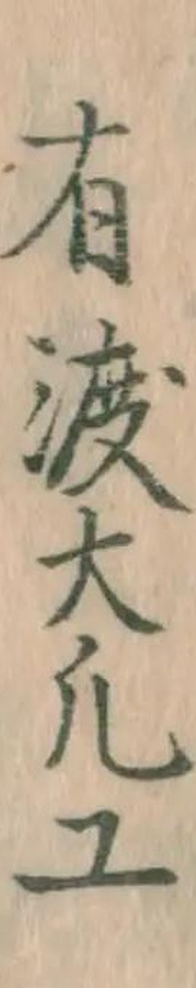有渡大凢工
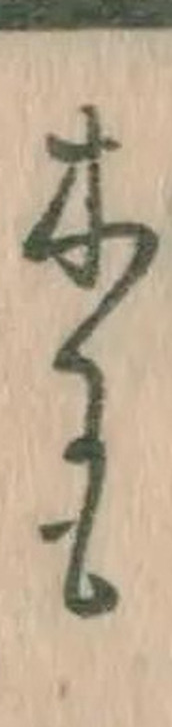木にも
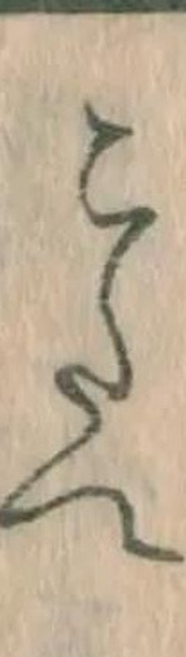こたへ

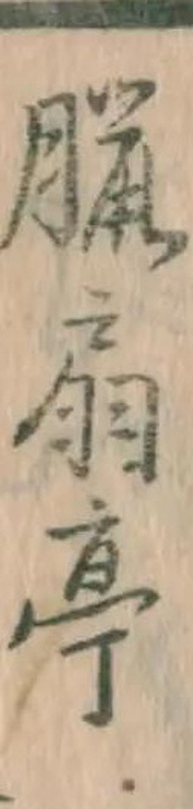臘扇亭
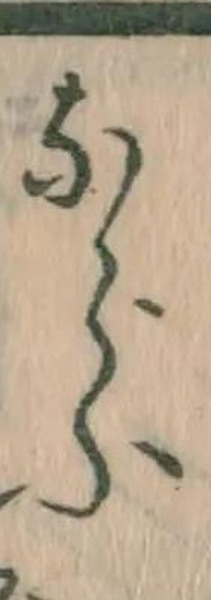ならふ
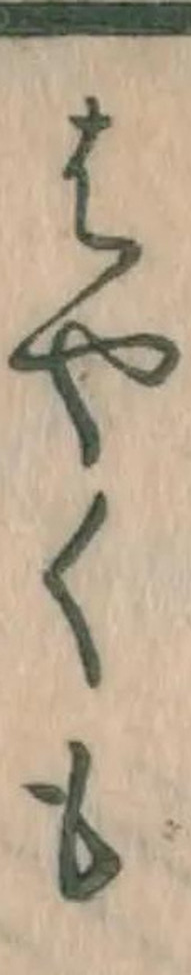はやくも

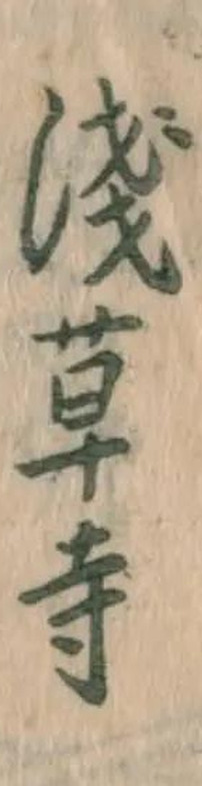浅草寺
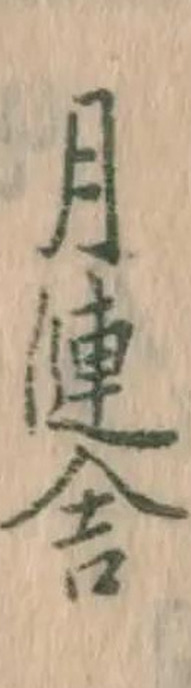月漣舎
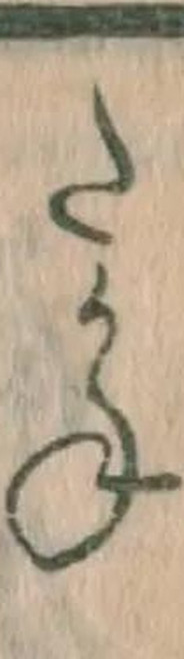たかね
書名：駿河舞 3巻
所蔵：国立国会図書館 National Diet Library, JAPAN
